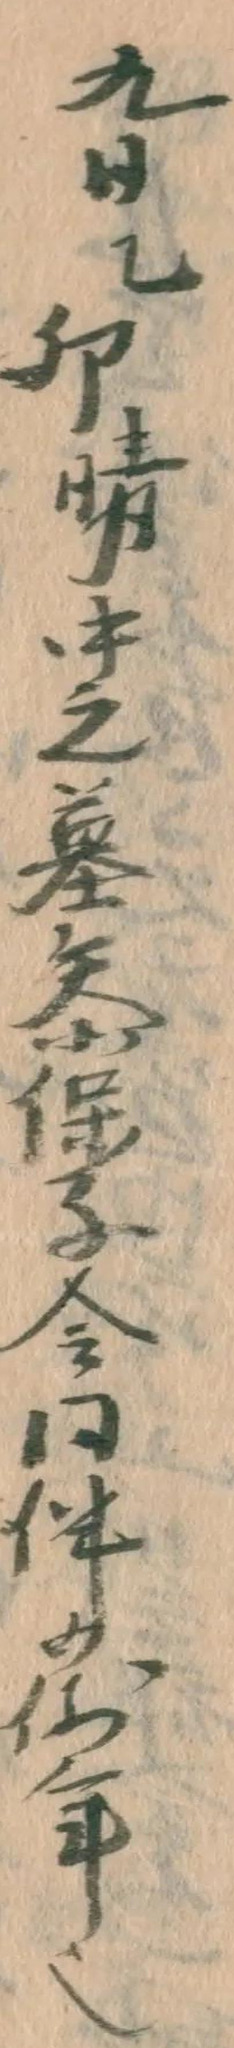九日乙卯晴中之墓参保子令同伴如例年也
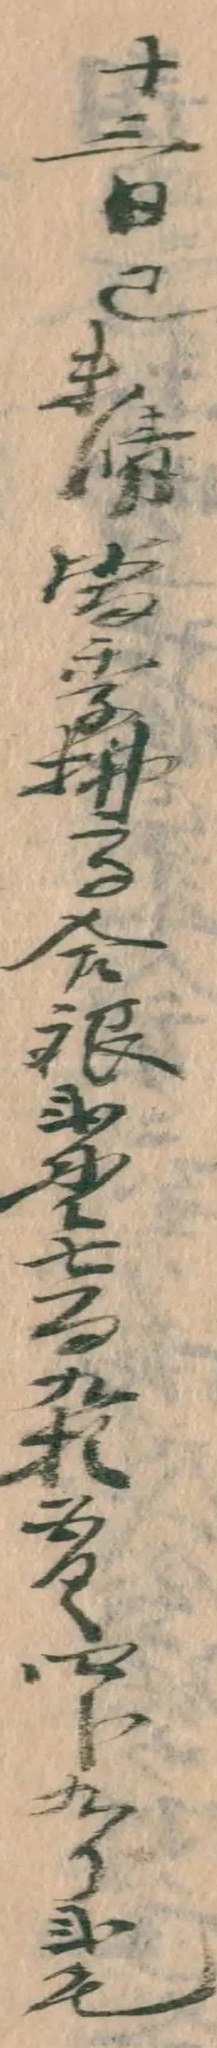十三日巳未晴當季払高合銀弐貫七百九拾五匁四分九り弐毛
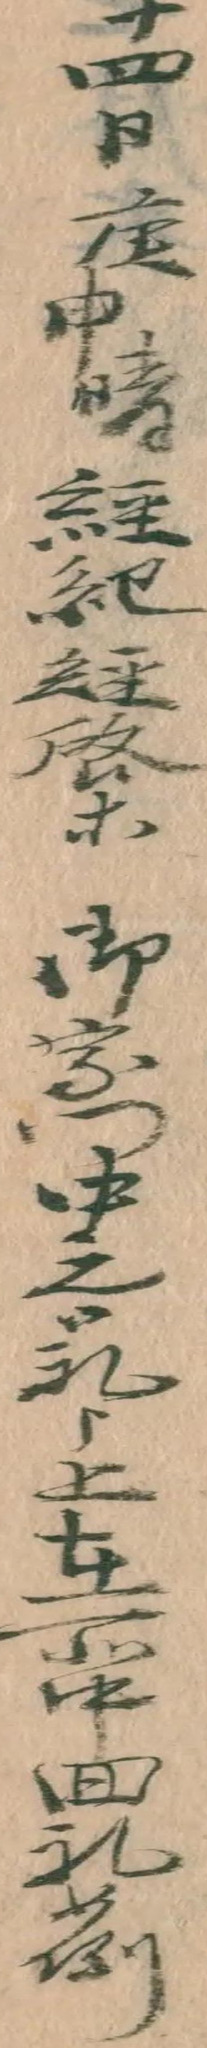十四日庚申晴経紀経啓等御家門中元御礼申上在所中回礼如例
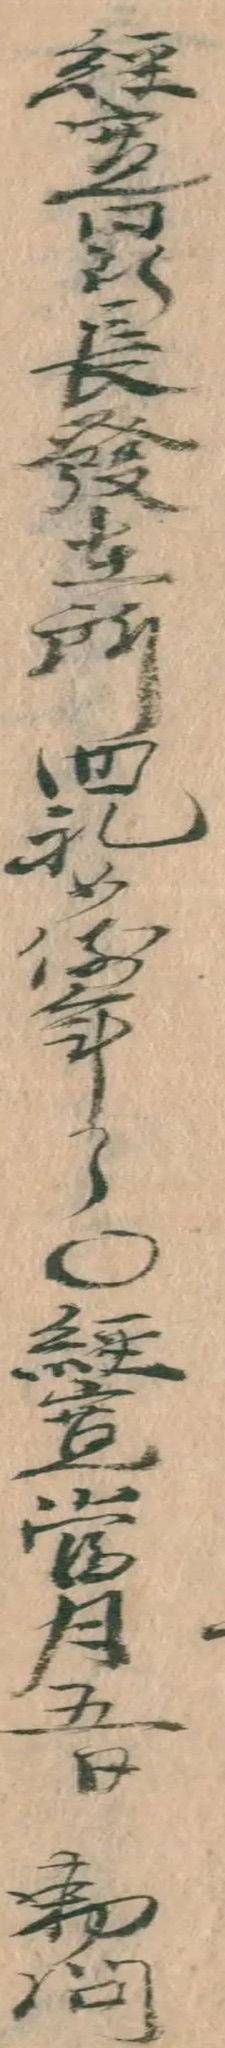経寛同断長發在所回礼如例年了○経覚當月五日勅問
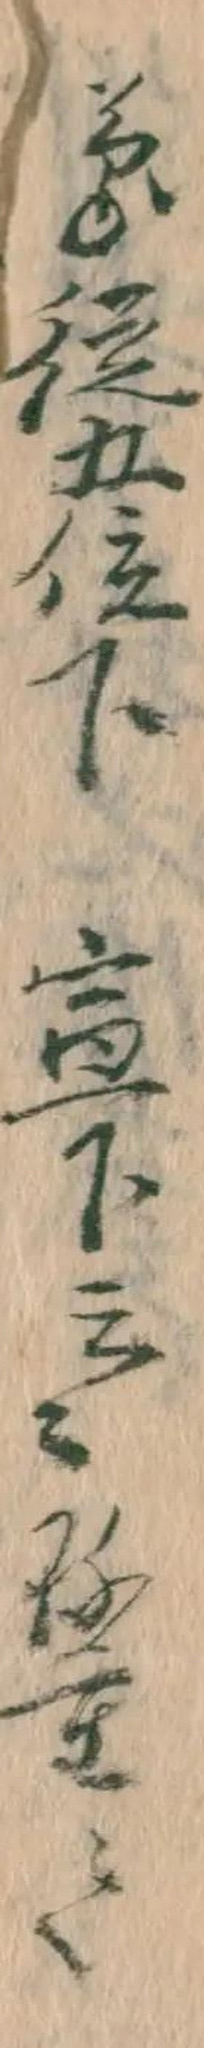蒙従五位下宣下云々珍重々々
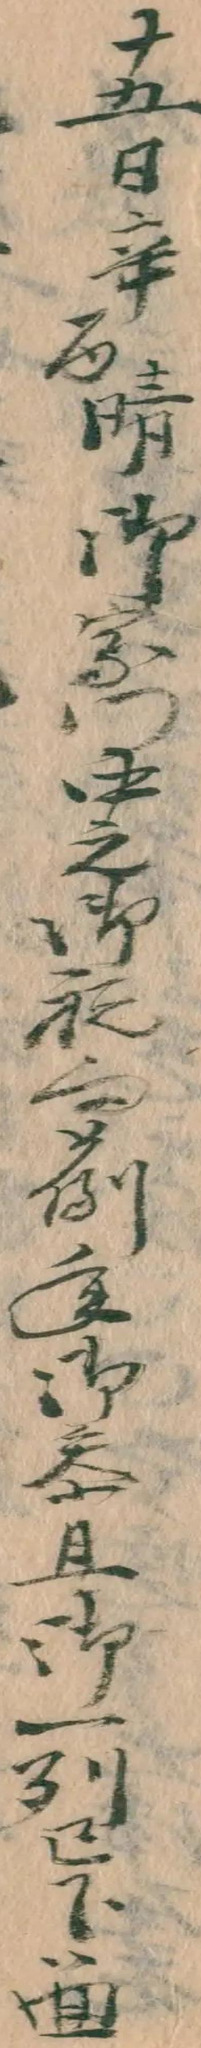十五日辛酉晴御家門中元御祝向如例年御参且御一列已下御回
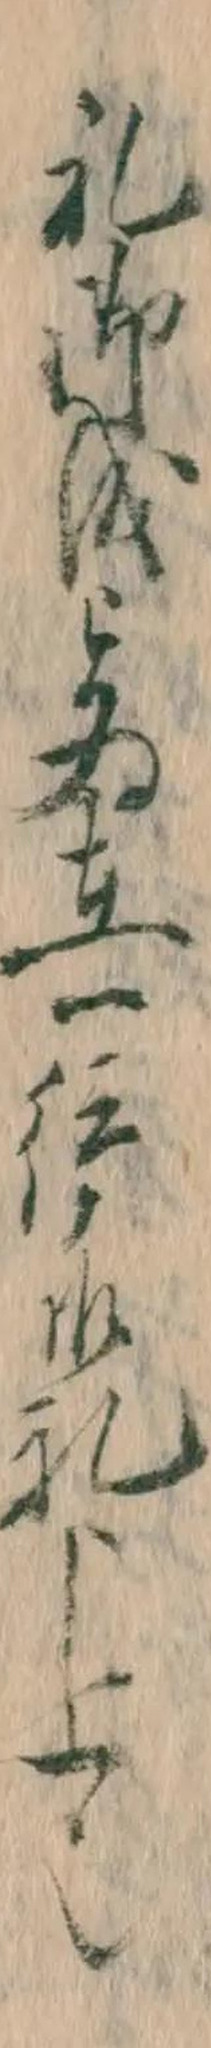礼御成被為在一統御礼申上也
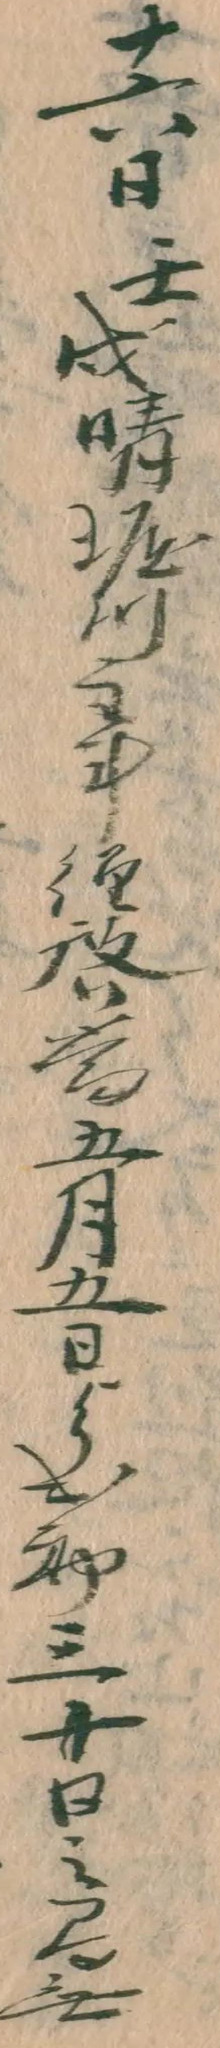十六日壬戌晴堀川主斗経啓當五月五日より出勤三十日之間無
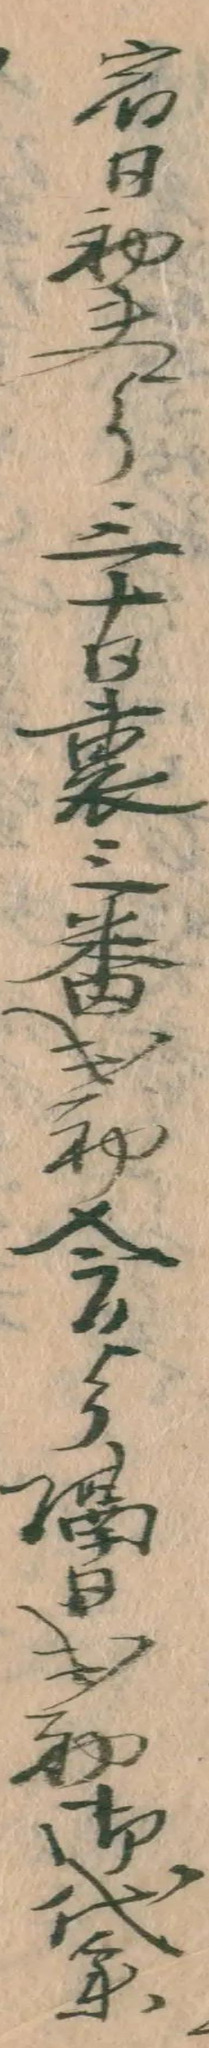宿日初夫より三十日裏三番出勤今日より隔日出勤御代参
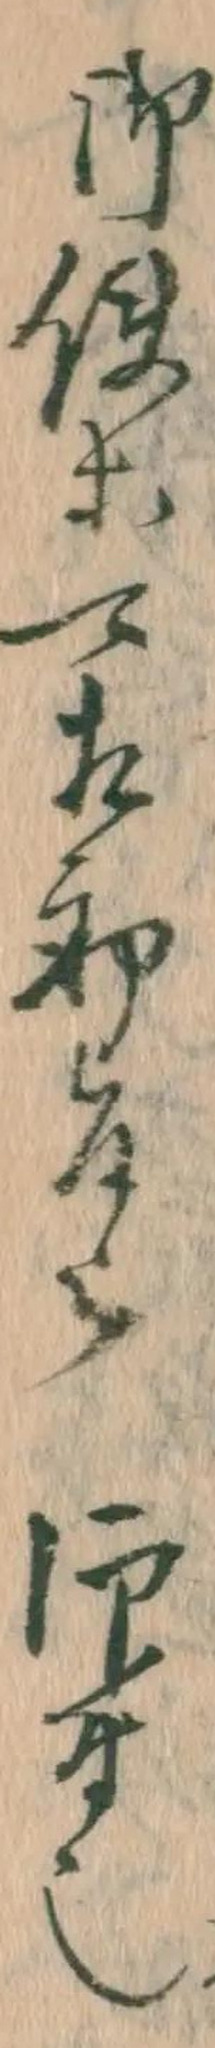御使等可相勤旨被仰付候也
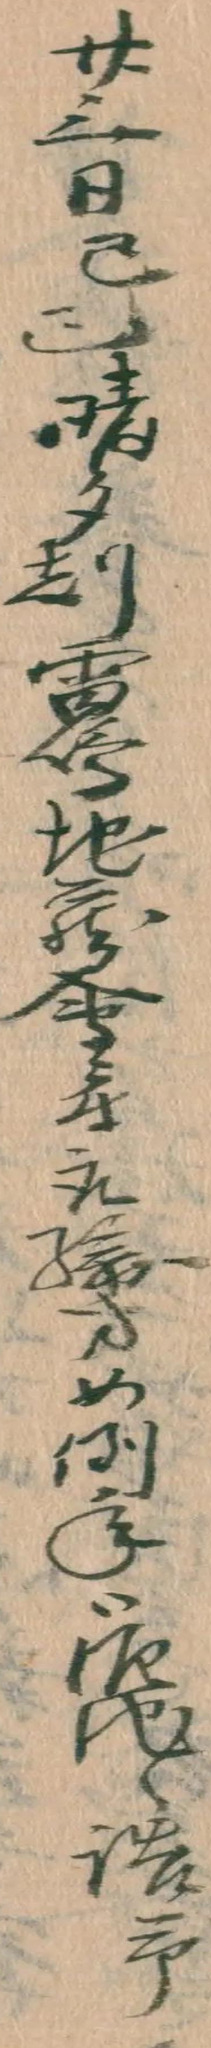廿三日己巳晴夕刻雷鳴地蔵會ニ付取締方如例年御泥地へ詰予
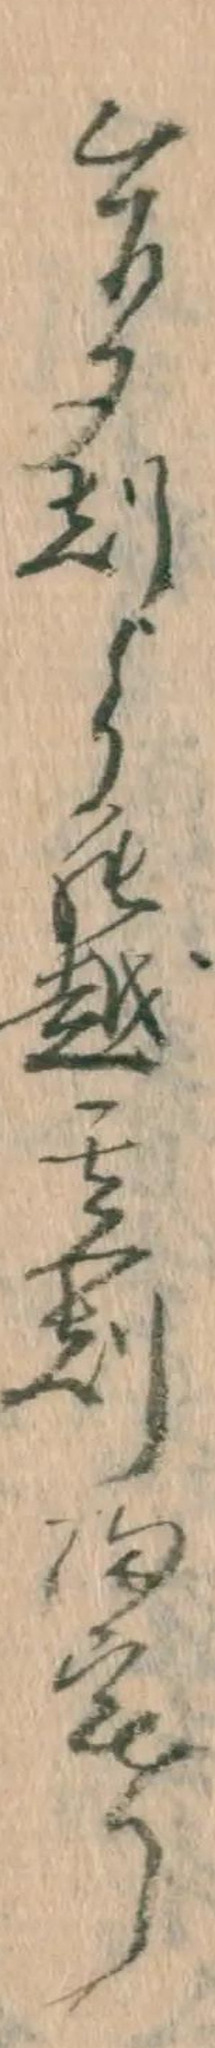今日夕刻より罷越亥刻帰宅了
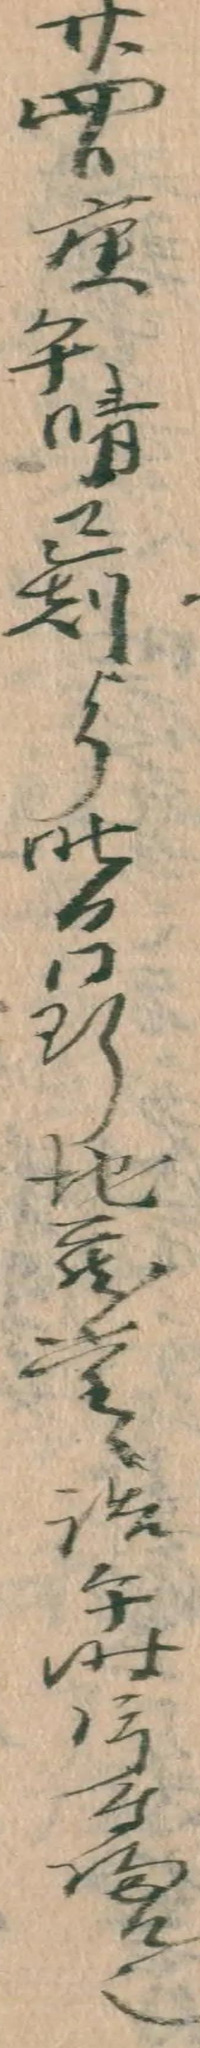廿四日庚午晴巳刻より昨日同断地蔵堂へ詰午時片付帰ル也
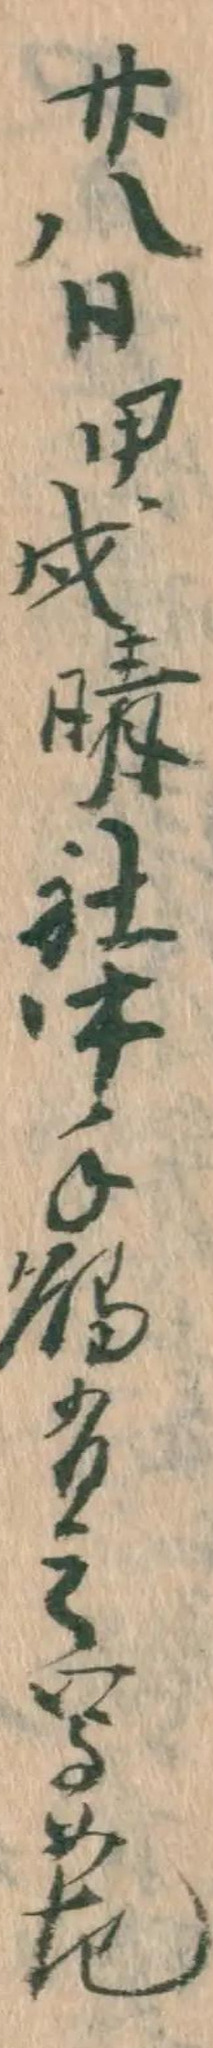廿八日甲戌晴社中手觸有之写如左
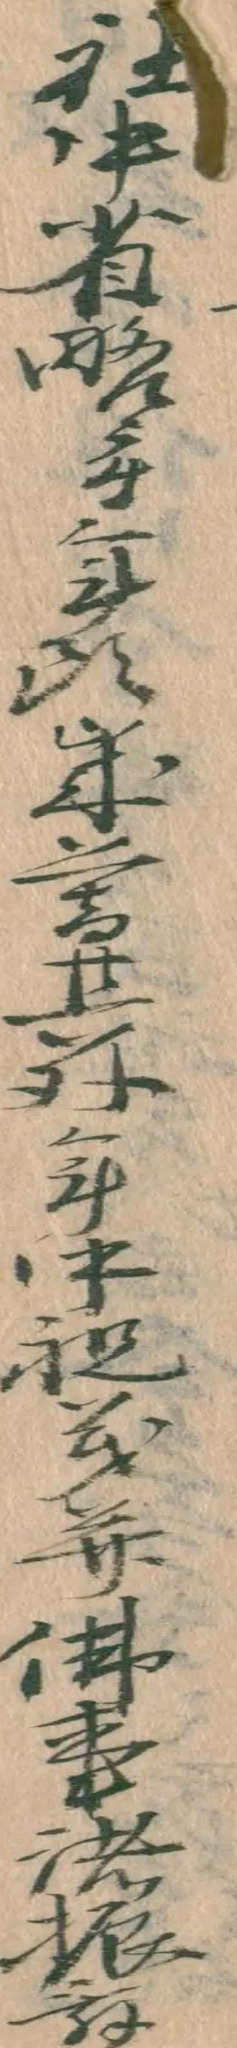社中省略ニ付年頭歳暮其外年中祝義幷仏事諸振舞
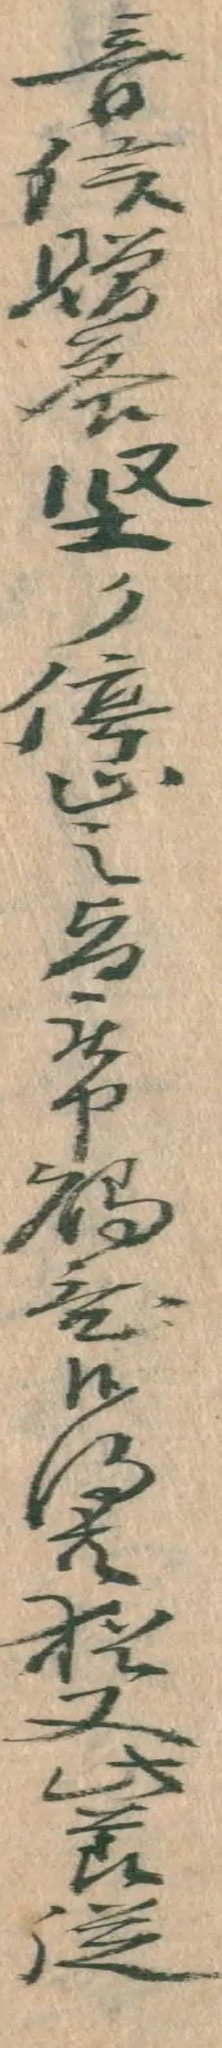音信贈答堅ク停止之旨被申觸置候得共猶又此節従
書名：賀茂社記録. 第69冊
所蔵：国立国会図書館 National Diet Library, JAPAN
